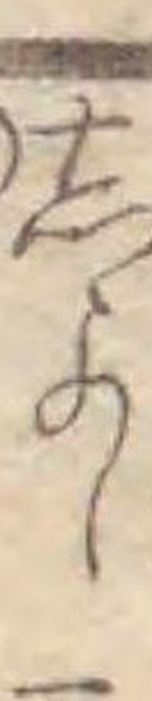しよし
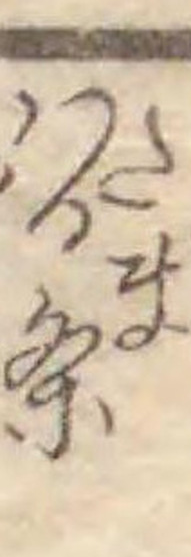はる条
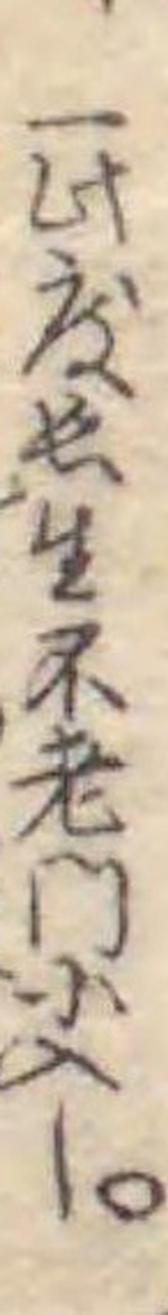一此度長生不老門に入し
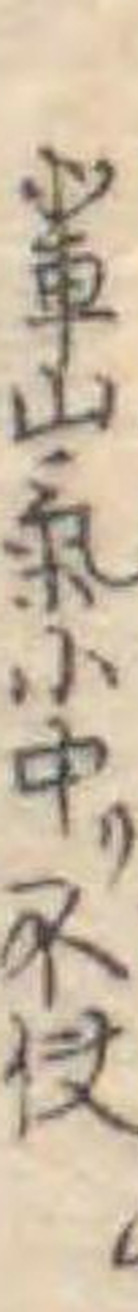輩山気に中不便
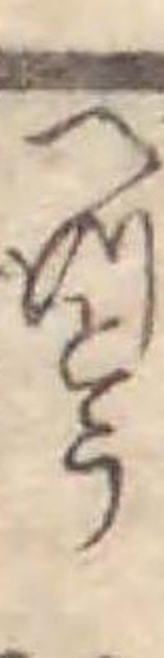べつとう
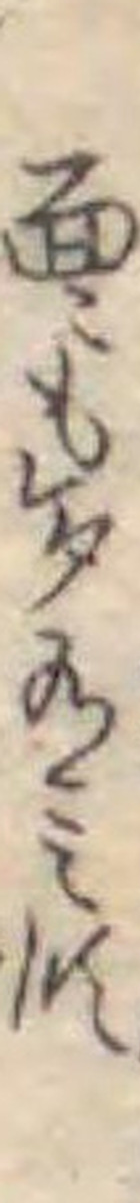面々も多有之段
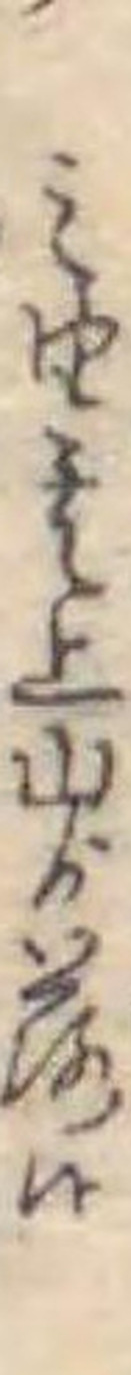之由其上山ゟ落候
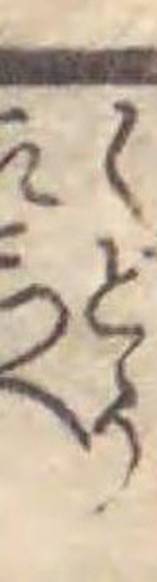くどう
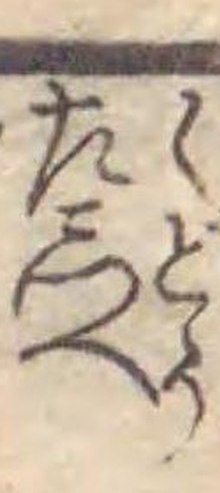左衛門へ
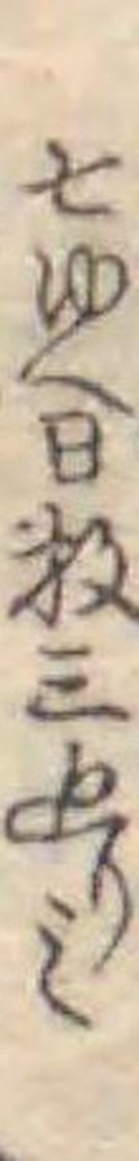七ゆへ日数三廻り之
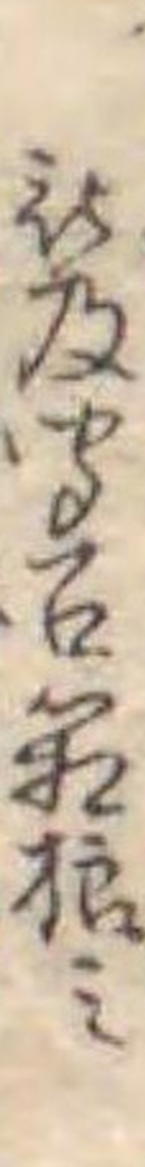被及聞召箱根之
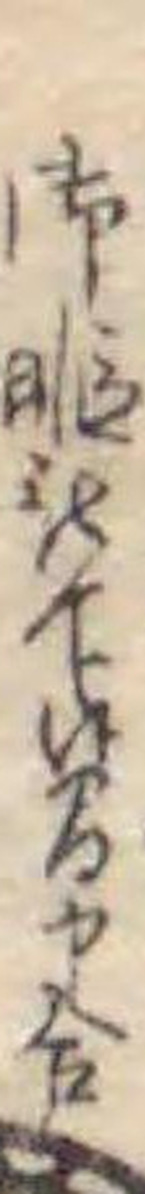御暇被下候間申合
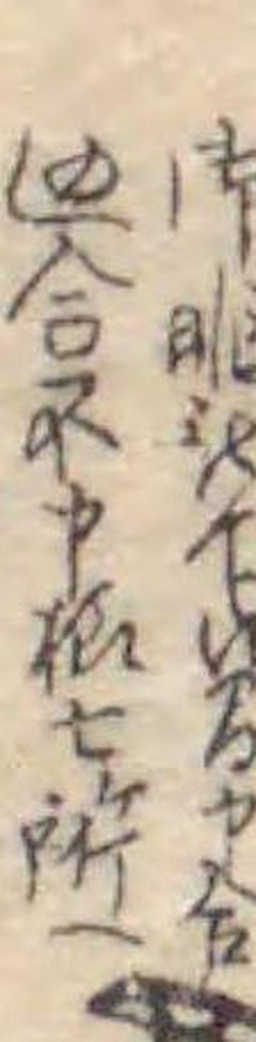込合不申様七ヶ所へ
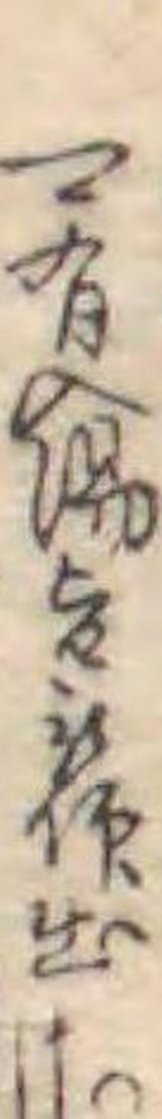可有入湯旨被仰出
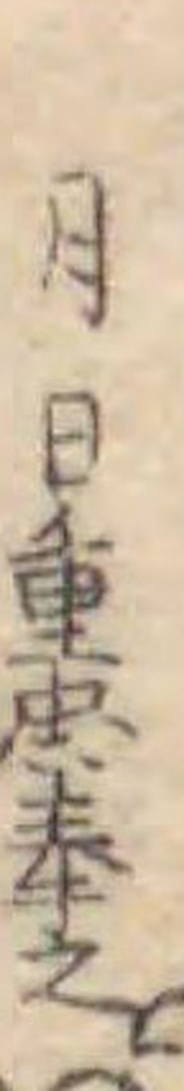月日重忠奉之

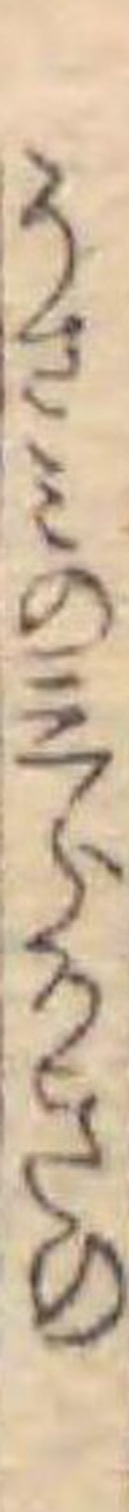うさみの三郎かさの
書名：文武二道万石通 : 3巻
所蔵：国立国会図書館 National Diet Library, JAPAN
